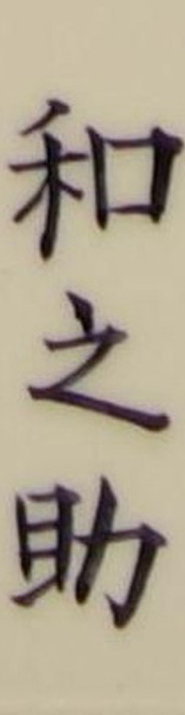和之助
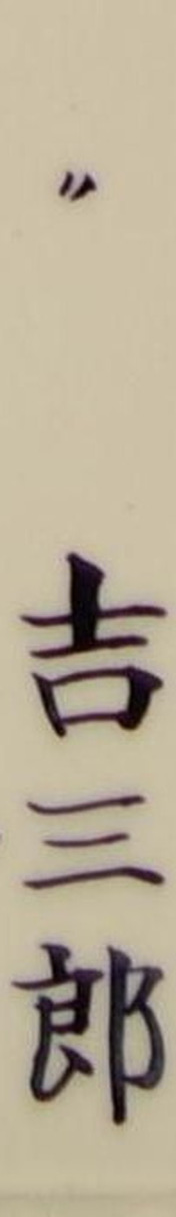吉三郎
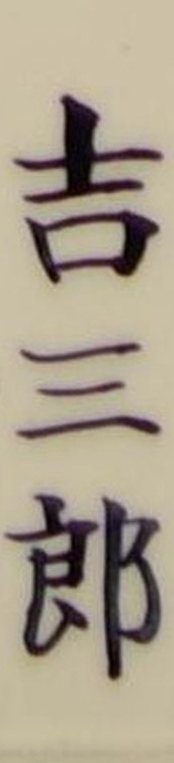吉三郎
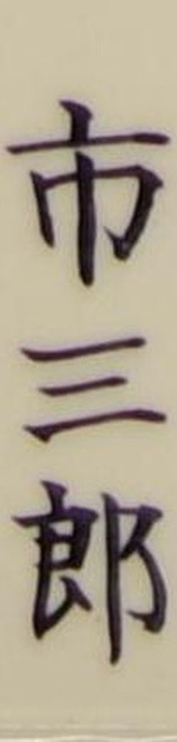市三郎
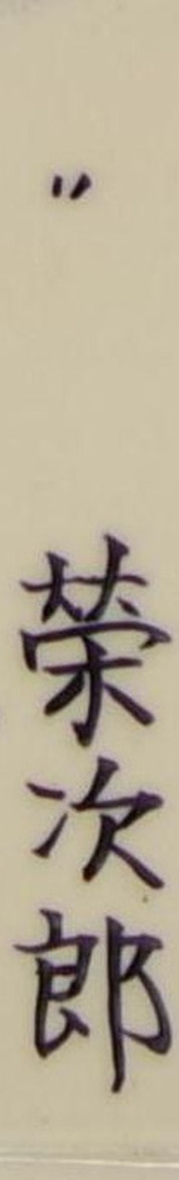榮次郎
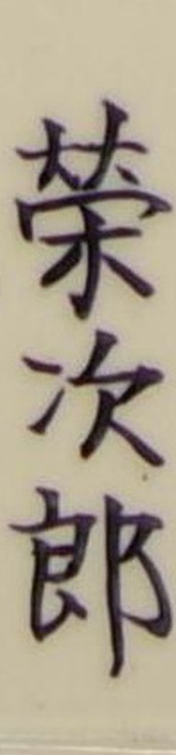榮次郎
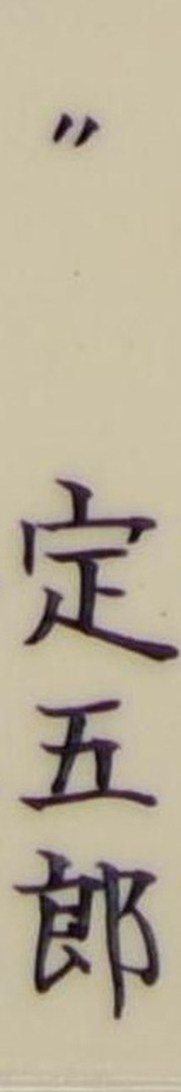定五郎
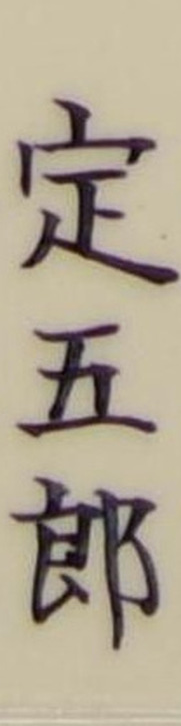定五郎
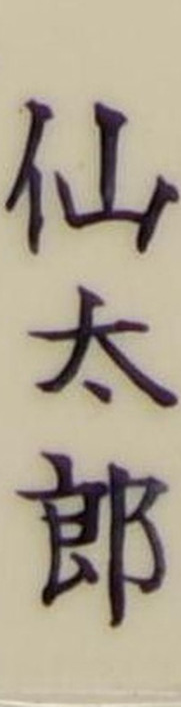仙太郎
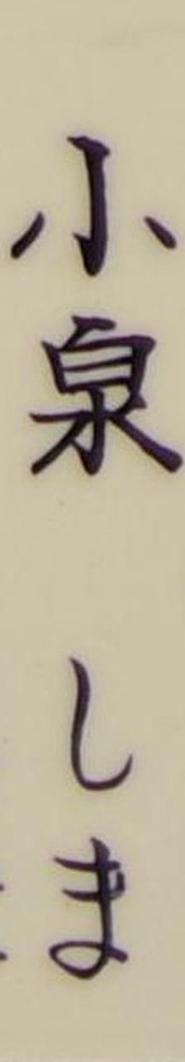小泉しま

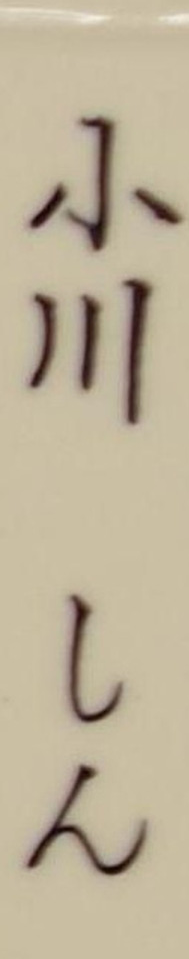小川しん
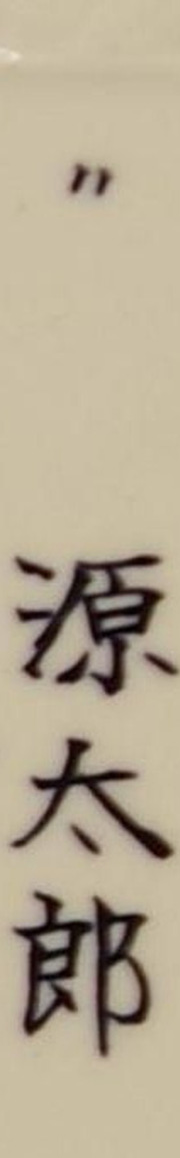源太郎
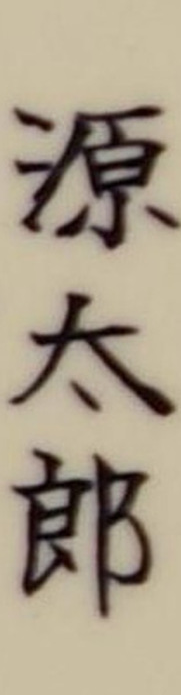源太郎
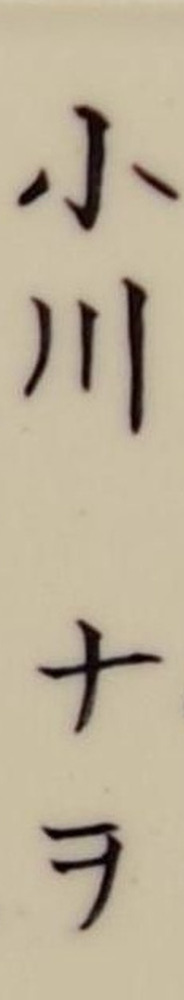小川ナヲ
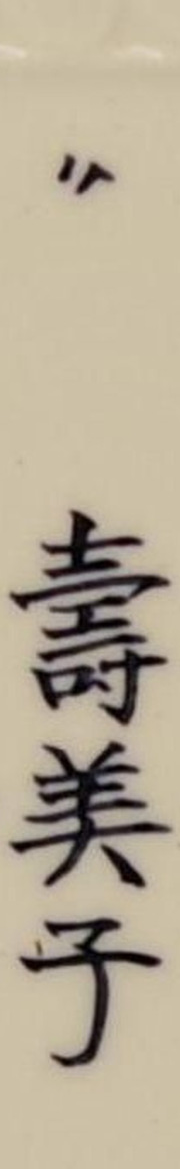壽美子
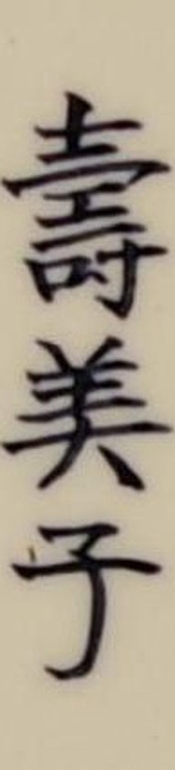壽美子
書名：E~L
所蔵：高野山金剛峯寺
